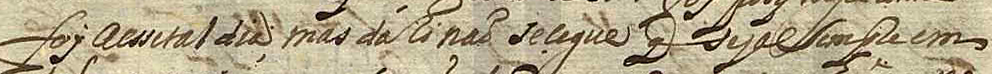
foy a esse tal dia, mas dahi naõ se cegue q̄ seja Sempre em
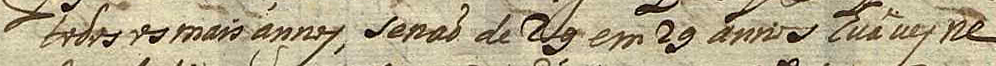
todos os mais annos, senaõ de 29, em 29 annos huā ues ne
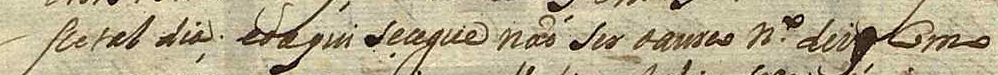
sse tal dia; e daqui se cegue naõ ser o aureo n.o de i9 Como
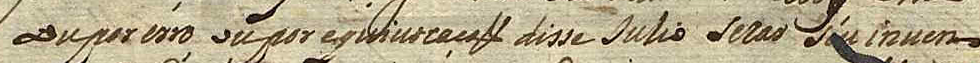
ou por erro, ou por equiuocaçaõ disse Iulio sezar seu inuen
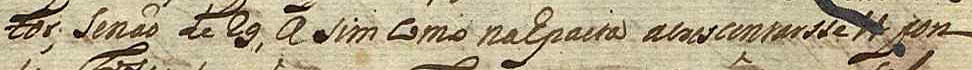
tor, senão de 29, asim como na Epacta acrescentarsse 11 pon
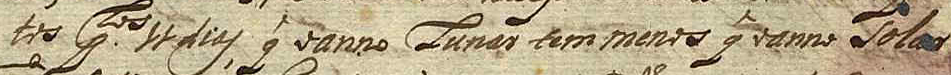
tos p.los 11 dias, q̄ o anno Lunar tem menos q̄ o anno solar
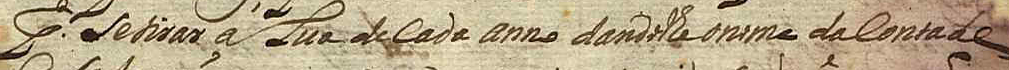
p.a se tirar a Lua de cada anno dandolhe o nome da Conta de
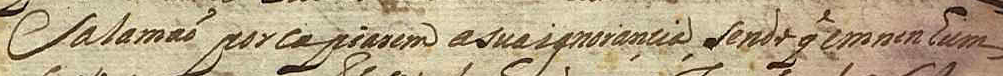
Salamaõ por copiarem a sua ignorancia, sendo q̄ em nenhum
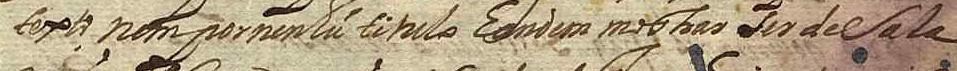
texto, nem por nenhū titulo handem mostrar ser de Sala
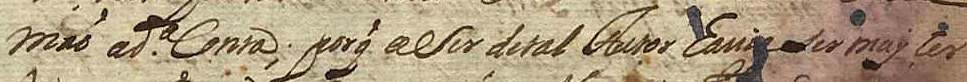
maõ a d.a Conta; porq̄ a Ser de tal Autor haui_ ser muy Çer
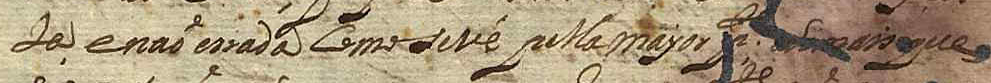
ta, e naõ errada Como se vé pella mayor p.te _mais que
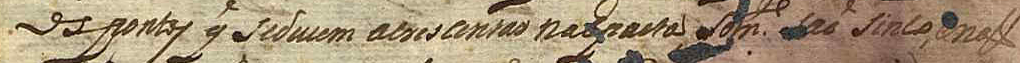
os pontos q̄ se deuem acrescentar na Epacta som.te saõ sinco, e naõ
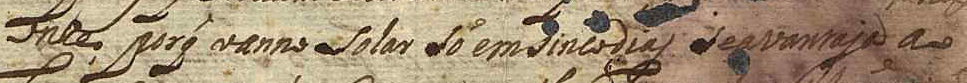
onze, porq̄ o anno solar só em sinco dias se avantaja ao
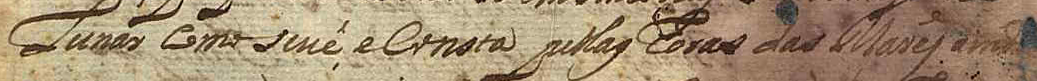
Lunar como se uê, e consta pellas horas das Marês aind
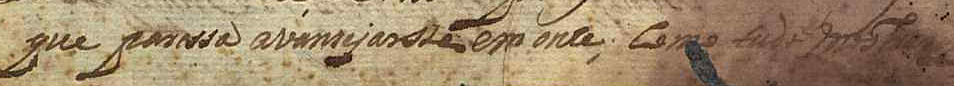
que paressa avantejarsse em onze, como tudo mostra
